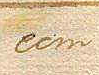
com
